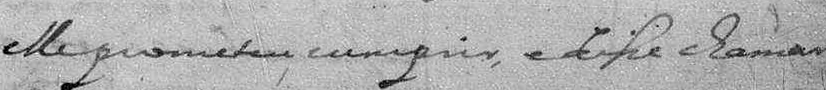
elle prometeu cumprir, e disse chamar
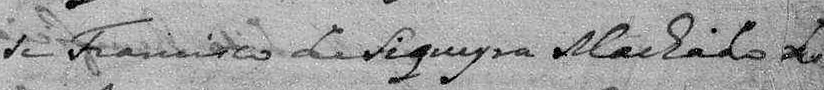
se Francisco de siqueyra Machado di
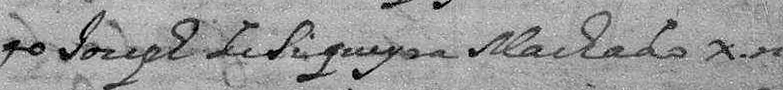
go Iozeph de Siqueyra Machado x. n.
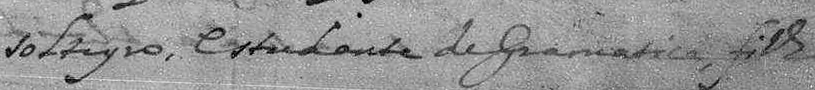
solteyro, estudante de Gramatica, filh
